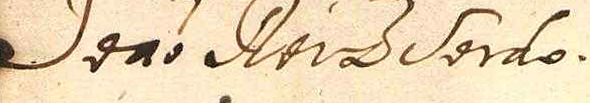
Ioaõ Roiz̄ Sordo.
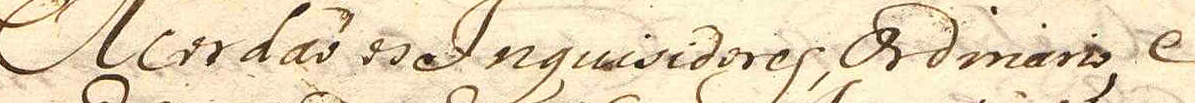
Acordaõ os Inquisidores, Ordinario, e
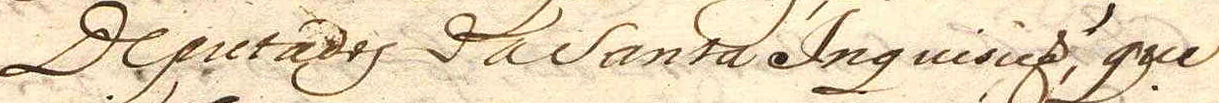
Deputados da Santa Inquisiçaõ, que
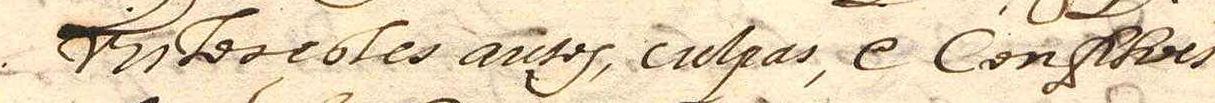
vistos estes autos, culpas e confissoẽs
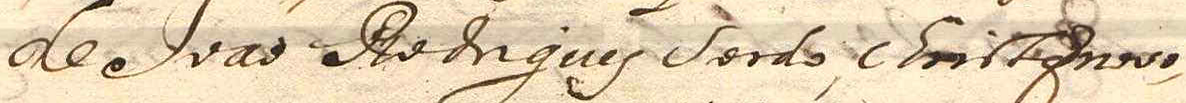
de Ioaõ Rodrigues Sordo, christaõ novo,
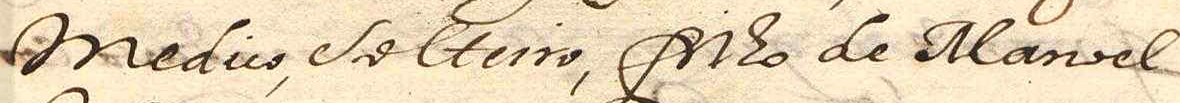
medico, solteiro, filho de Manoel
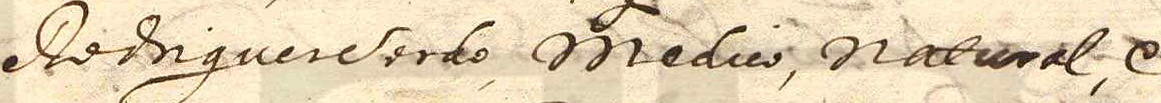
Rodrigues Sordo, medico, natural, e
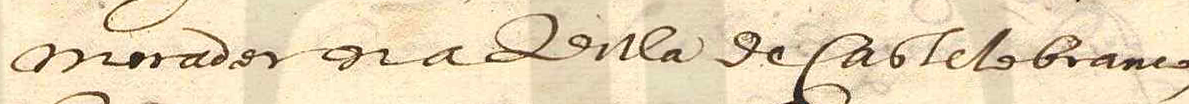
morador na Villa de Castello branco,
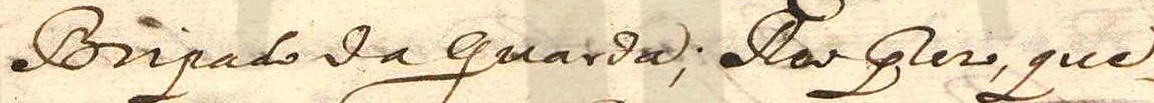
Bispado da Guarda; Reo prezo, que
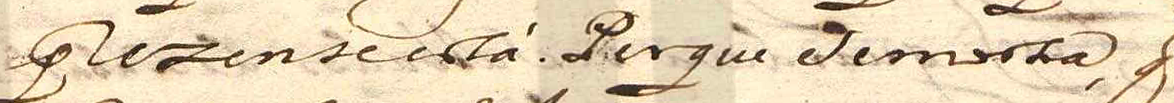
prezente está. Porque se mostra, q̄
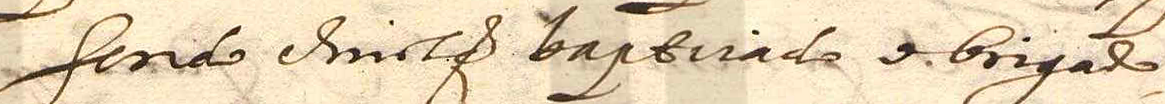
sendo christaõ baptizado obrigado
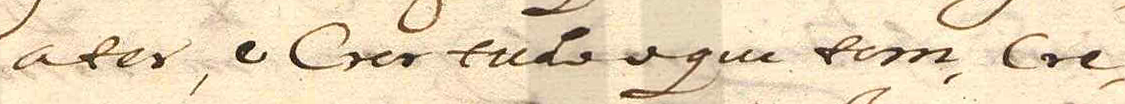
a ter, e Crer tudo o que tem, Cre,
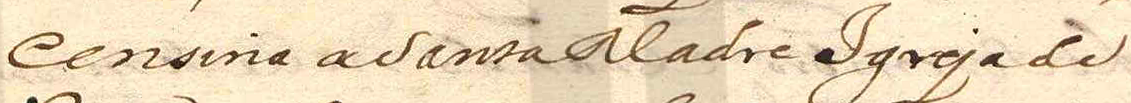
e ensina a santa Madre Igreja de
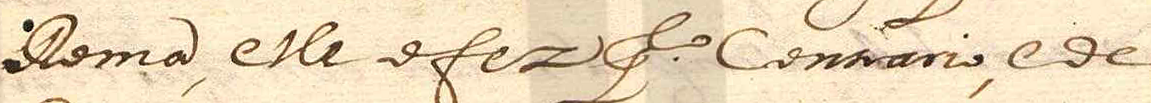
Roma, elle o fez p.lo Contrario, e de
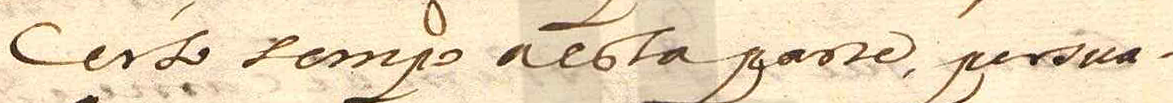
certo tempo a esta parte, persua
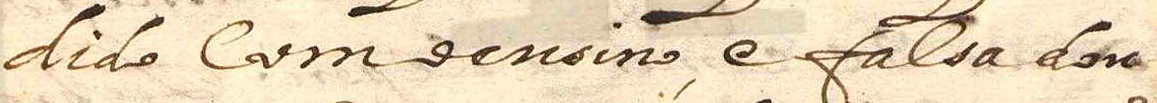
dido Com o ensino, e falsa dou
